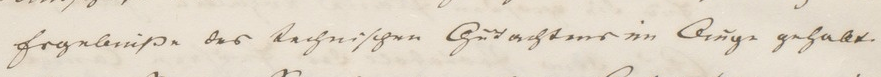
Ergebniße des technischen Gutachtens im Auge gehabt
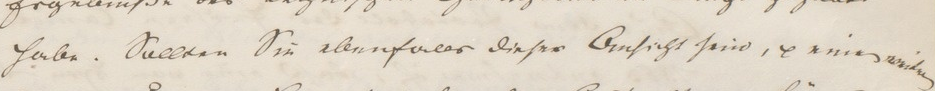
habe. Sollten Sie ebenfalls dieser Ansicht sein, & eine weitere
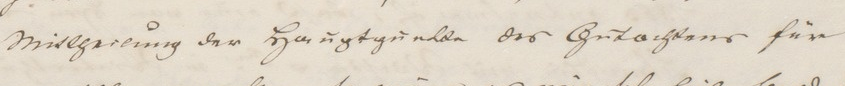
Mittheilung der Hauptpunkte des Gutachtens für
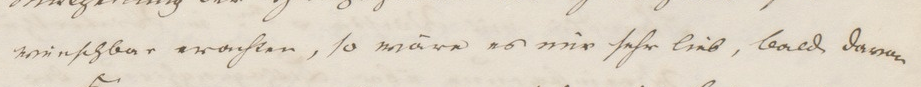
wünschbar erachten, so wäre es mir sehr lieb, bald davon
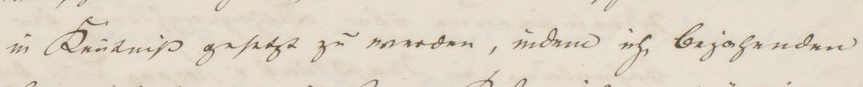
in Kenntniß gesetzt zu werden, indem ich bejahenden
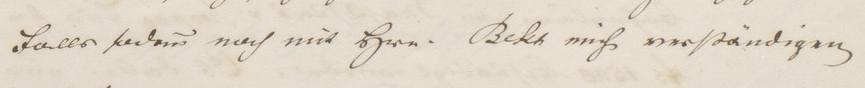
Falls sodann noch mit Hrn. Bekh mich verständigen
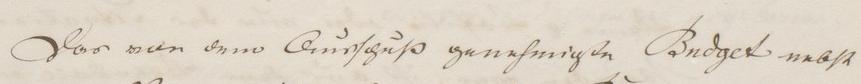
Das von dem Ausschuß genehmigte Budget nebst
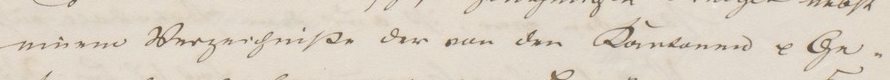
einem Verzeichniße der von den Kantonen & Ge-
